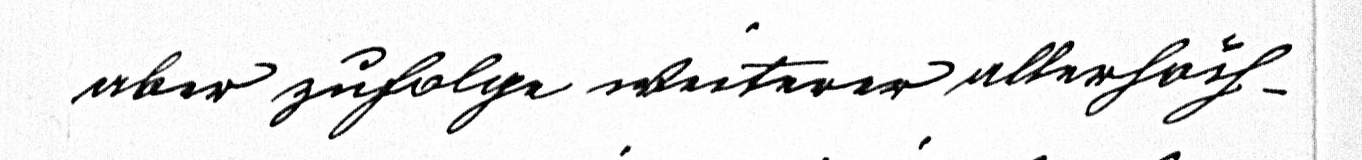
aber zufolge weiterer allerhöch¬
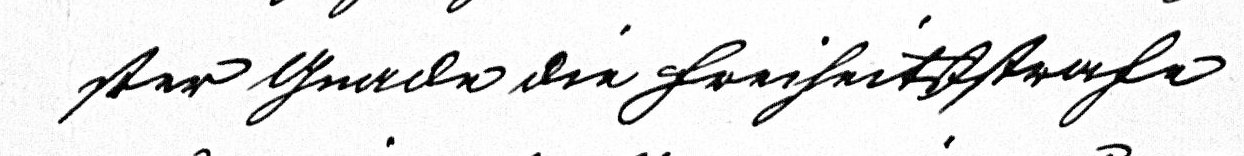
ster Gnade die Freiheitsstrafe
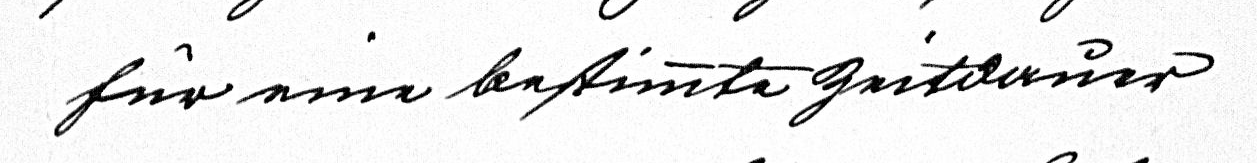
für eine bestimmte Zeitdauer
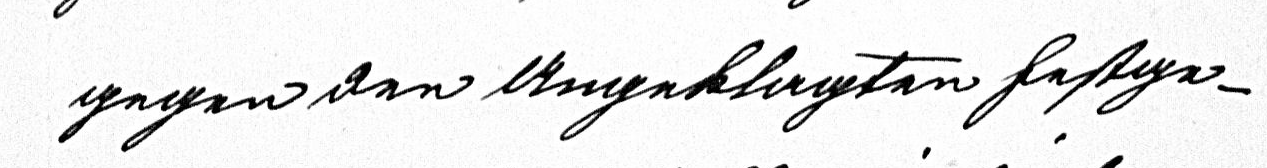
gegen den Angeklagten festge¬
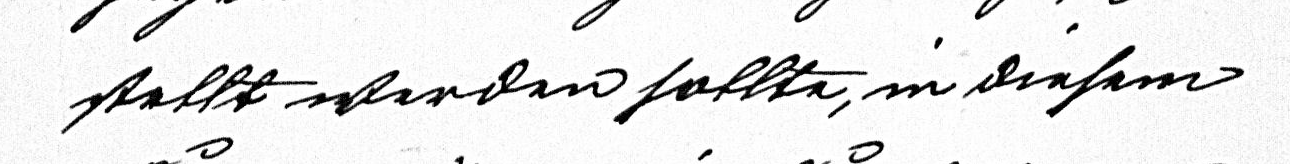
stellt werden sollte, in diesem
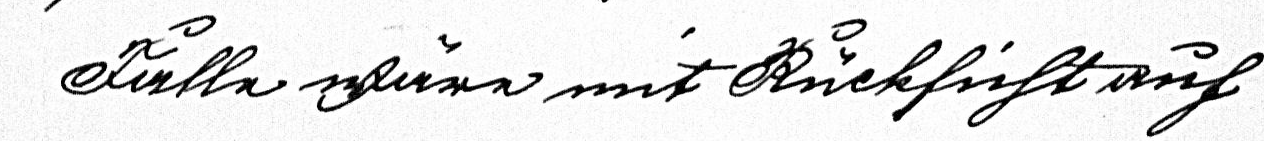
Falle wäre mit Rücksicht auf
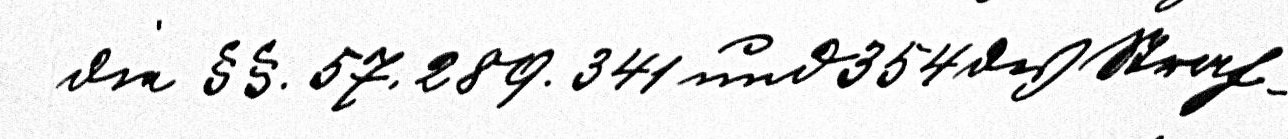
die §§. 57.289.341 und 354 des Straf¬
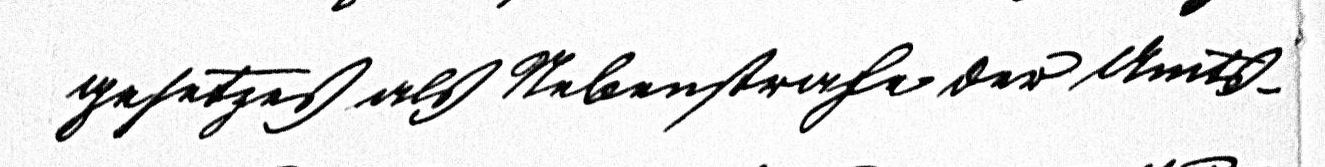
gesetzes als Nebenstrafe der Amts¬
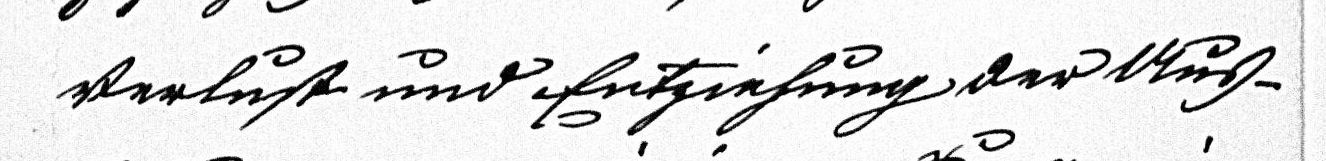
verlust und Entziehung der Aus¬
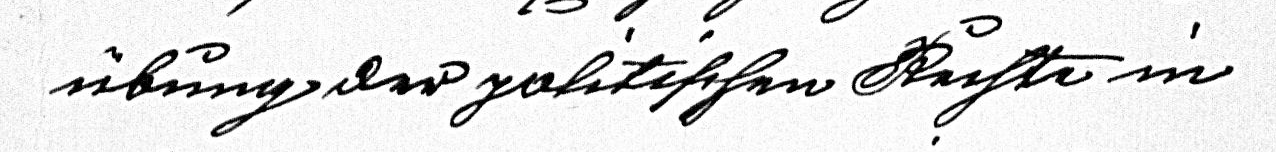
übung der politischen Rechte in
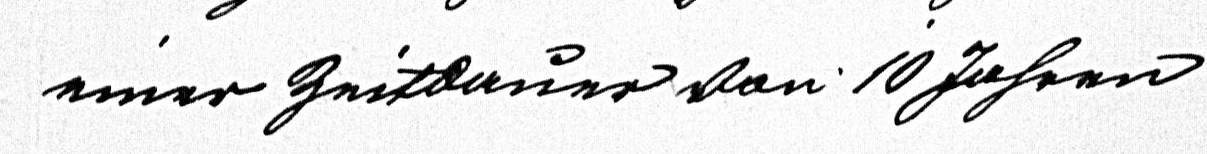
einer Zeitdauer von 10 Jahren
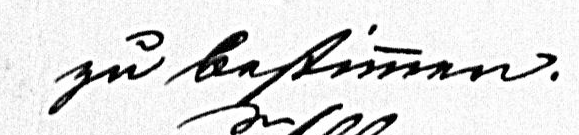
zu bestimmen.
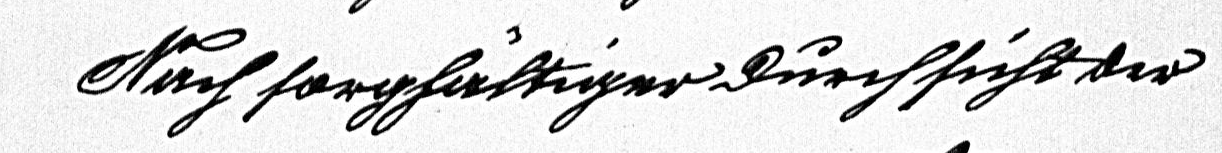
Nach sorghältiger Durchsicht der
